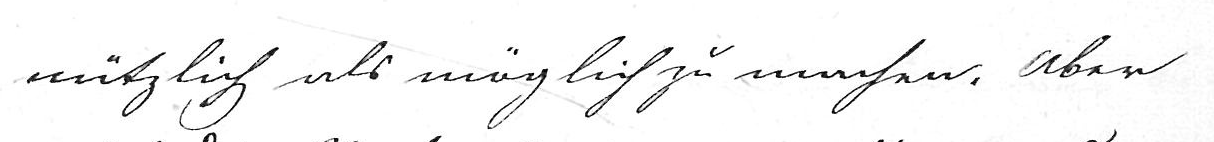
nützlich als möglich zu machen. Aber
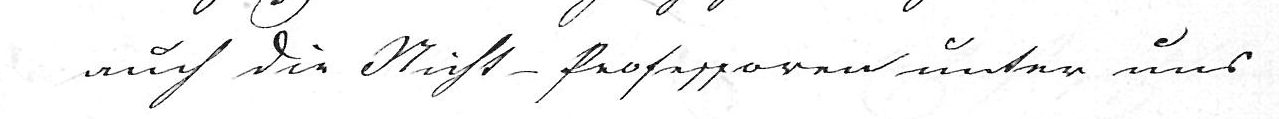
auch die Nicht-Professoren unter uns
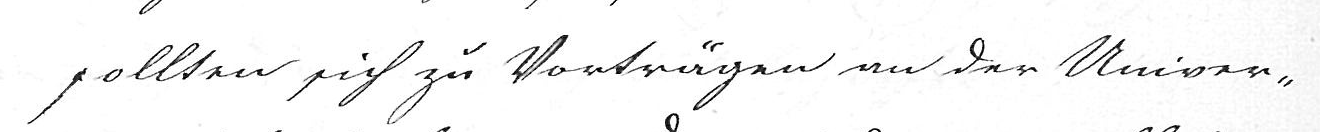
sollten sich zu Vorträgen an der Univer-
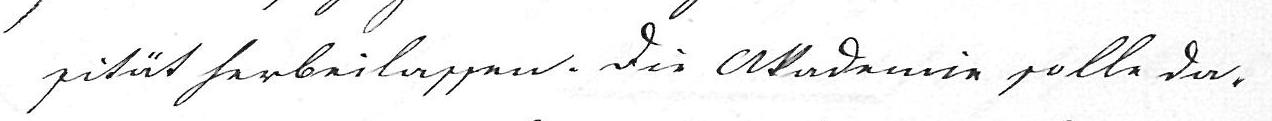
sität herbeilassen. Die Akademie solle da-
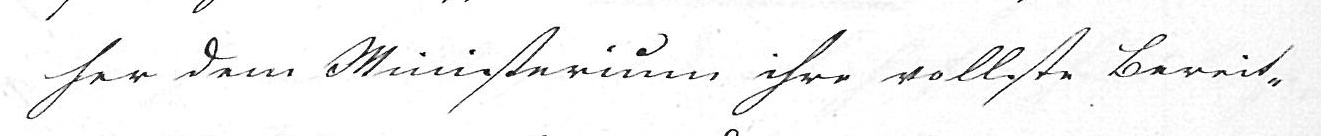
her dem Ministerium ihre vollste Bereit-
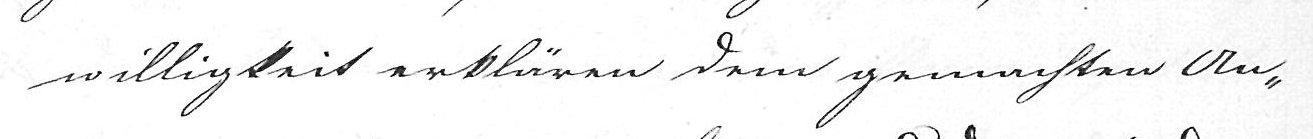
willigkeit erklären dem gemachten An-
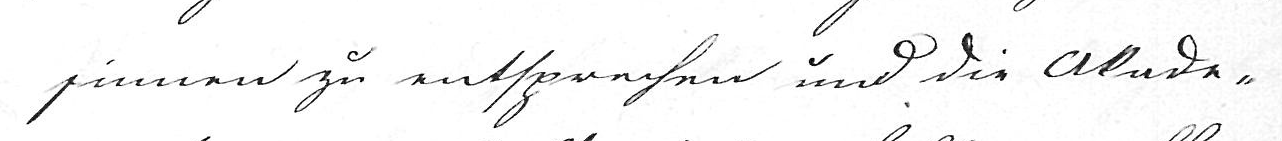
simmen zu entsprechen und die Akade-
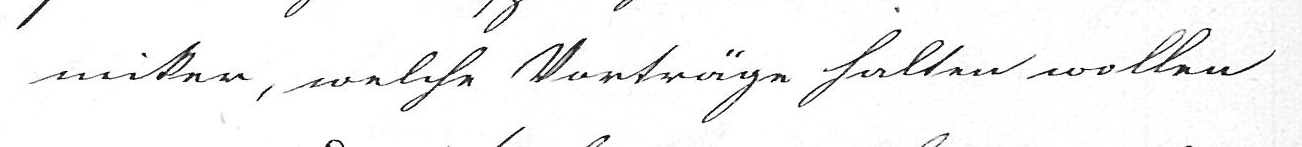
miker, welche Vorträge halten wollen
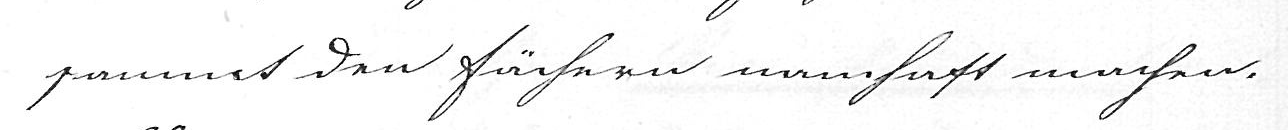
sammt den Fächern namhaft machen.
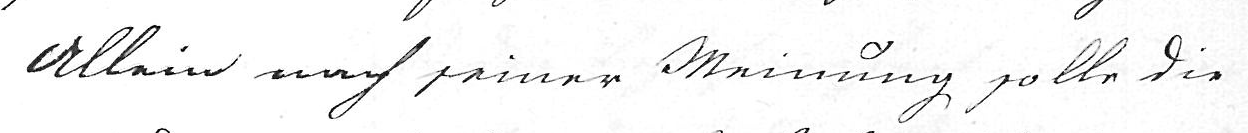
Allein nach seiner Meinung solle die
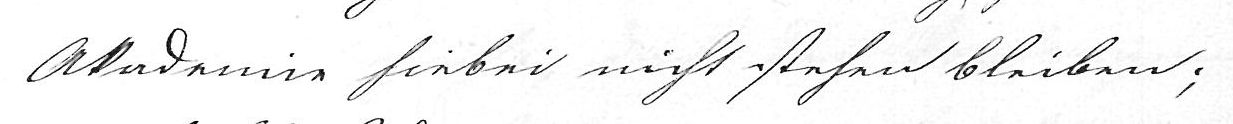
Akademie hiebei nicht stehen bleiben;
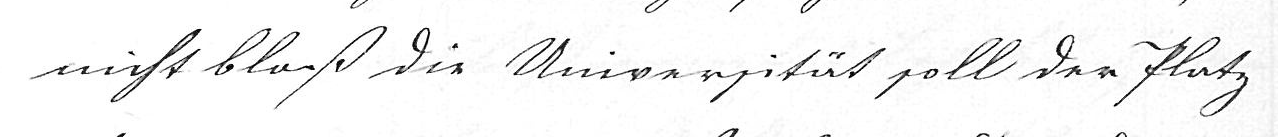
nicht bloß die Universität soll der Platz
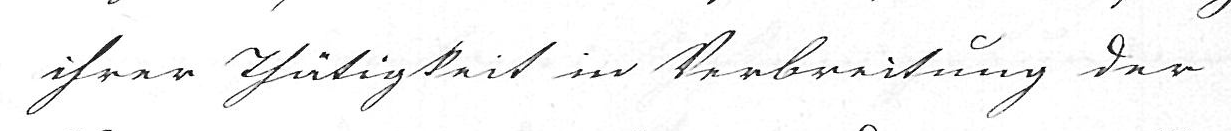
ihrer Thätigkeit in Verbreitung der
